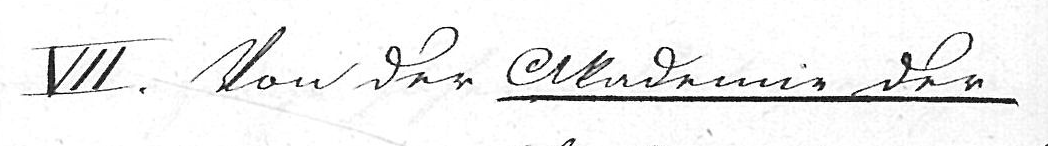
VII. Von der Akademie der
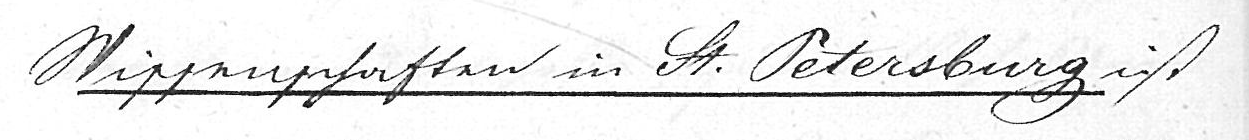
Wissenschaften in St. Petersburg ist
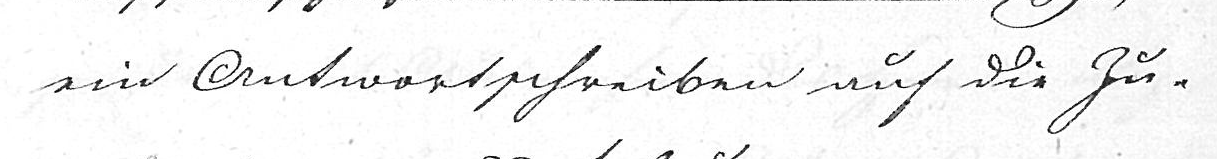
ein Antwortschreiben auf die Zu-
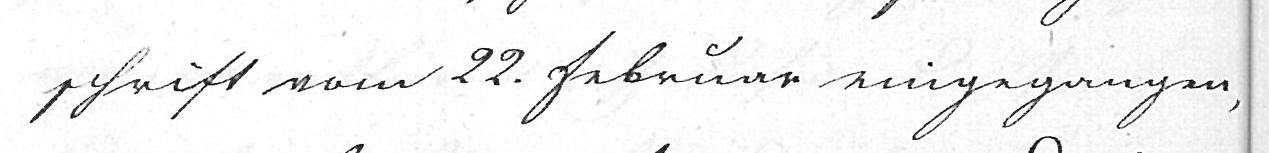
schrift vom 22. Februar eingegangen,
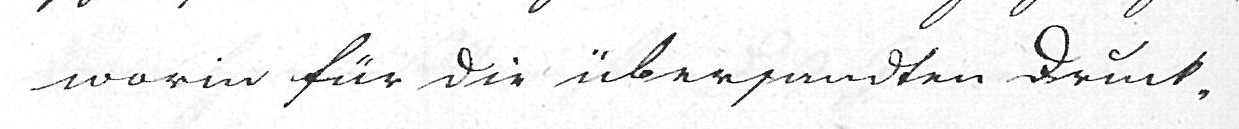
worin für die übersandten Druck-
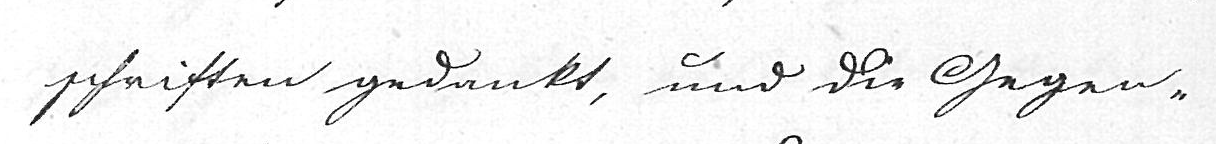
schriften gedankt, und die Gegen-
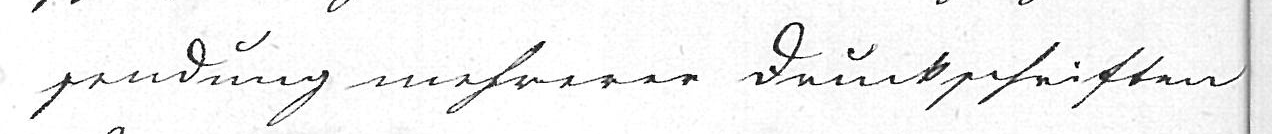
sendung mehrerer Druckschriften
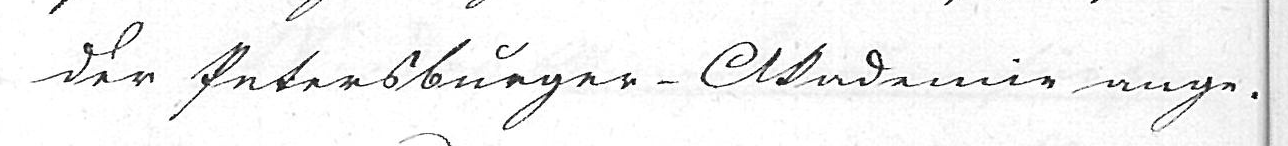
der Petersburger Akademie ange-
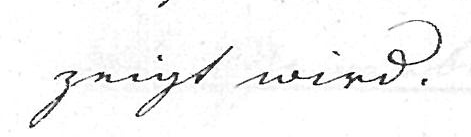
zeigt wird.
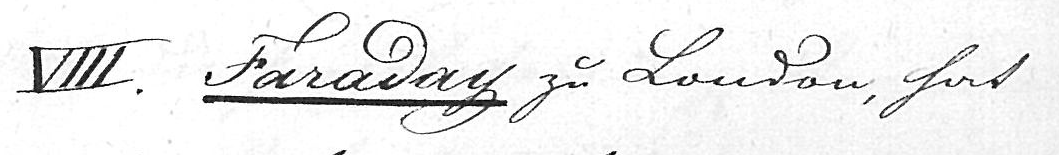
VIII. Faraday zu London hat
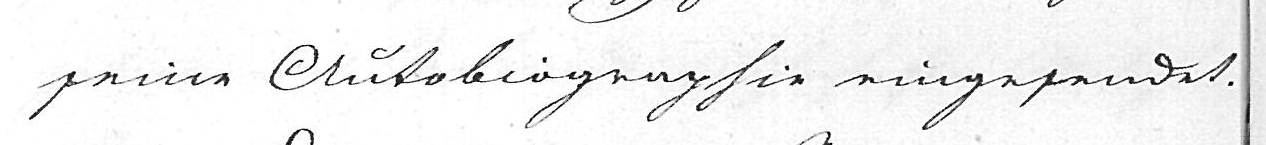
seine Autobiographie eingesendet.
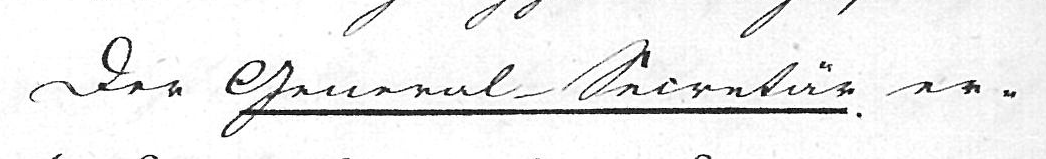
Der General-Secretär er-
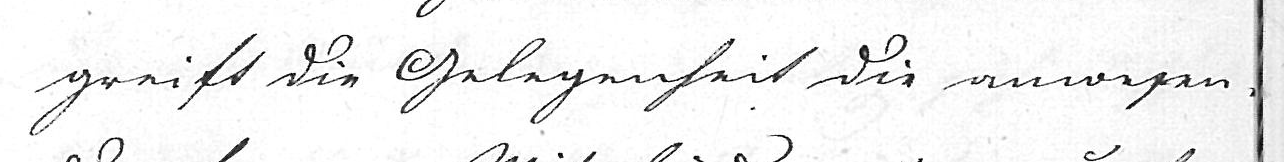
greift die Gelegenheit die anwesen-
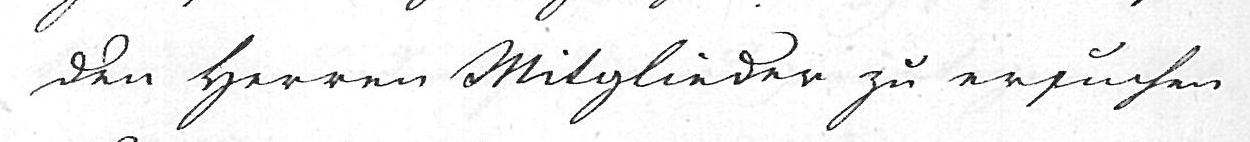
den Herren Mitglieder zu ersuchen
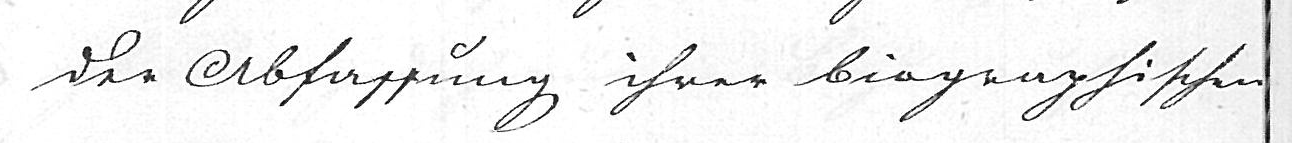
der Abfassung ihrer biographischen
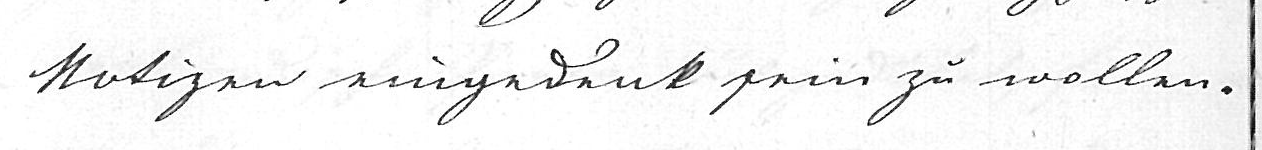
Notizen eingedenk sein zu wollen.
